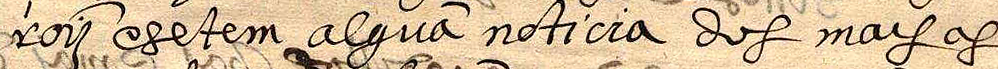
roiz̄ e se tem alguā noticia dos mais as
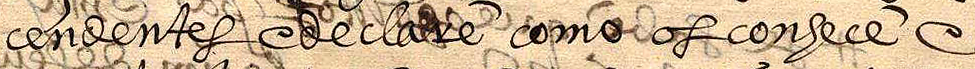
cendentes e declarē como os conhecē e
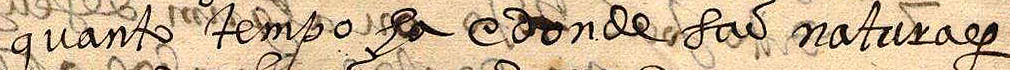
quanto tempo ha e donde saõ naturaes
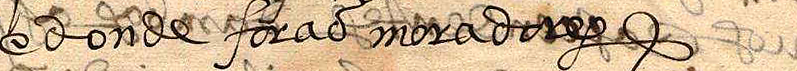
e donde foraõ moradores
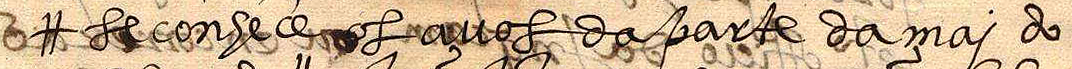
item se conhecē os auos da parte da maj do
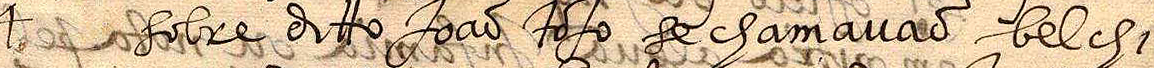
4 sobreditto Joaõ toJo se chamauaõ belchi
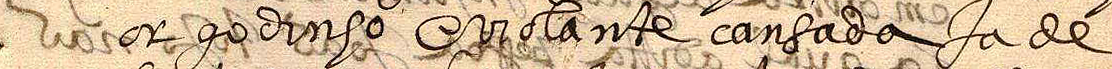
or godinho e violante cansada Ja de
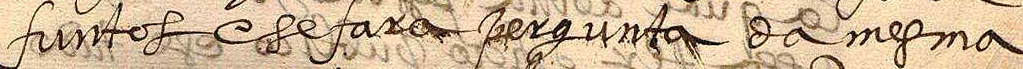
funtos e se fara pergunta da mesma
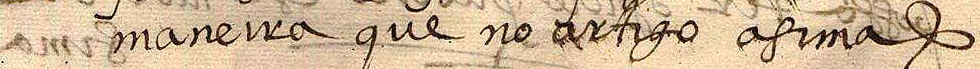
maneira que no artigo asima
